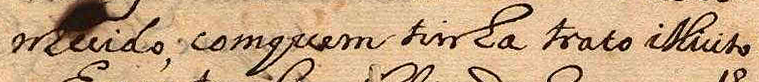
nhecido, com quem tinha trato illicito.
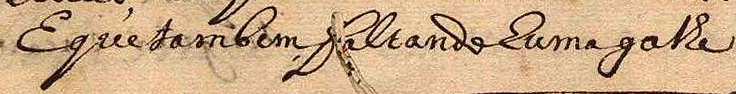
E que tambem, faltando huma galhe
